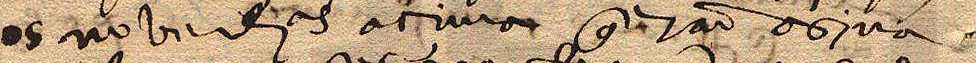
os nove djas açima q̄ erão asjna
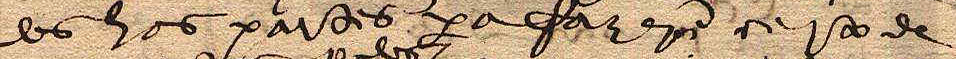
dos has partes ꝑa fazerē çerto de
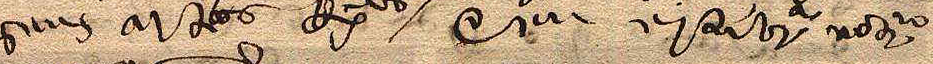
seus artos Rꝭdos / e eu ejtor vra notro
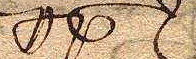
o estp̄
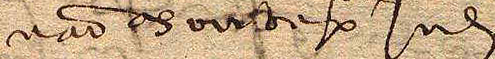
não as ouve p̄ Judj
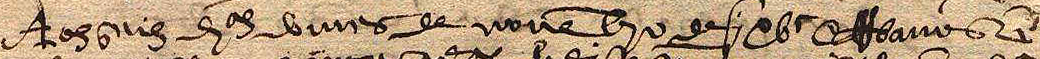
Aos seis djas do mes de nouēbro de j̄ e bc Rb anos̄ ē
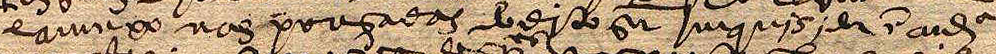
lamego nas pousadas do djto s̄or Jmqujsjdor ē audja
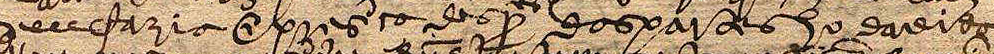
q̄ elle fazia ē presēça dos ꝓes das partes ho da dita
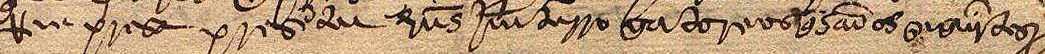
Ree presa presētou hūs Jmterrogatoreos q̄ são os seguj̄tes
